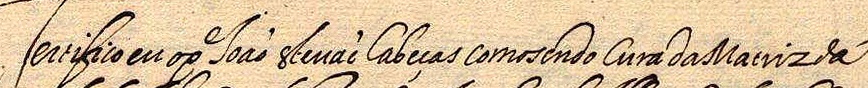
Certifico eu o pe João esteuaõ Cabeças como sendo Cura da Matriz da
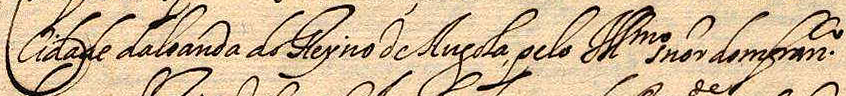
Cidade da loanda do Reyno de Angola, pelo Illmo snōr dom fran.co
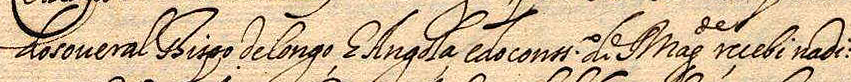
do soueral Bispo de Congo, E Angola, e do conss.o de Magde recebi na di
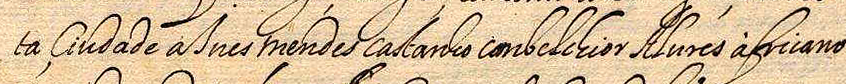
ta Ciudade a Ines mendes castanho con belchior Alures africano
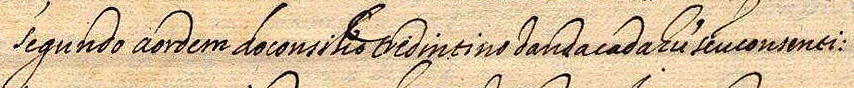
segundo a ordem do consilio tridentino dando cada hū seu consenti
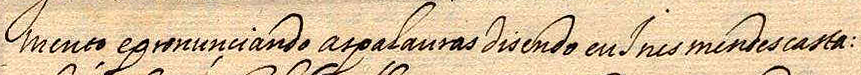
mento, e pronunciando as palauras disendo eu Ines mendes casta
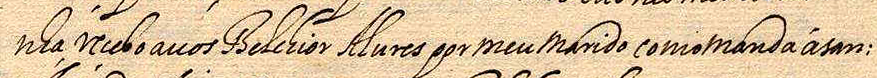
nha, recebo a uos Belchior Alures por meu marido como manda a san
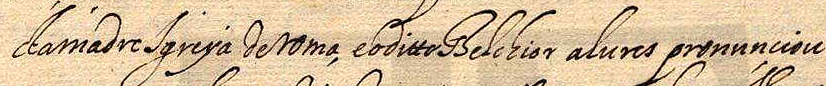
cta madre Igreya de roma, e o ditto Belchior alures pronunciou
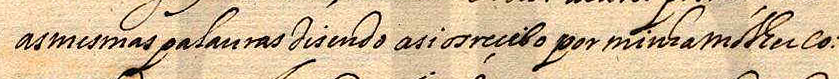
as mesmas palauras disendo asi os recibo por minha molher co
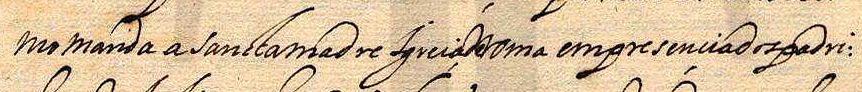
mo manda a sancta madre Igreia roma em presencia dos padri
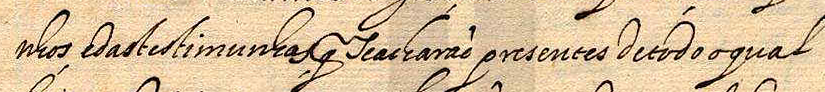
nhos, e das testimunhas q̄ se acharaõ presentes de todo o qual
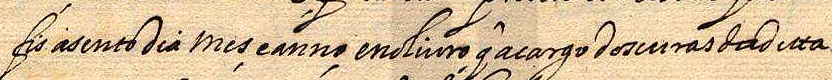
fis asento dia mes e anno, e no liuro q̄ a cargo dos curas da ditta
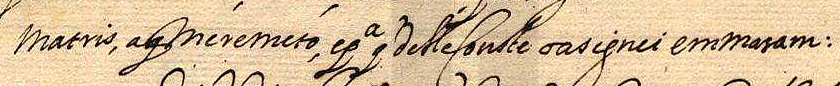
matris, a q̄ me remeto, e pa q̄ delle Conste o asignei em maram
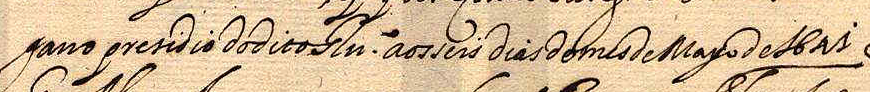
gano presidio do dito Ru.o aos seis dias do mes de Mayo de 164i
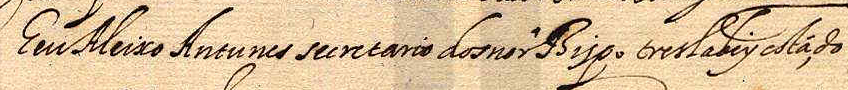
E eu Aleixo Antunes secretario do snor̄ Bispo tresladey está, do
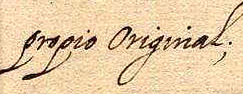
propio original;
